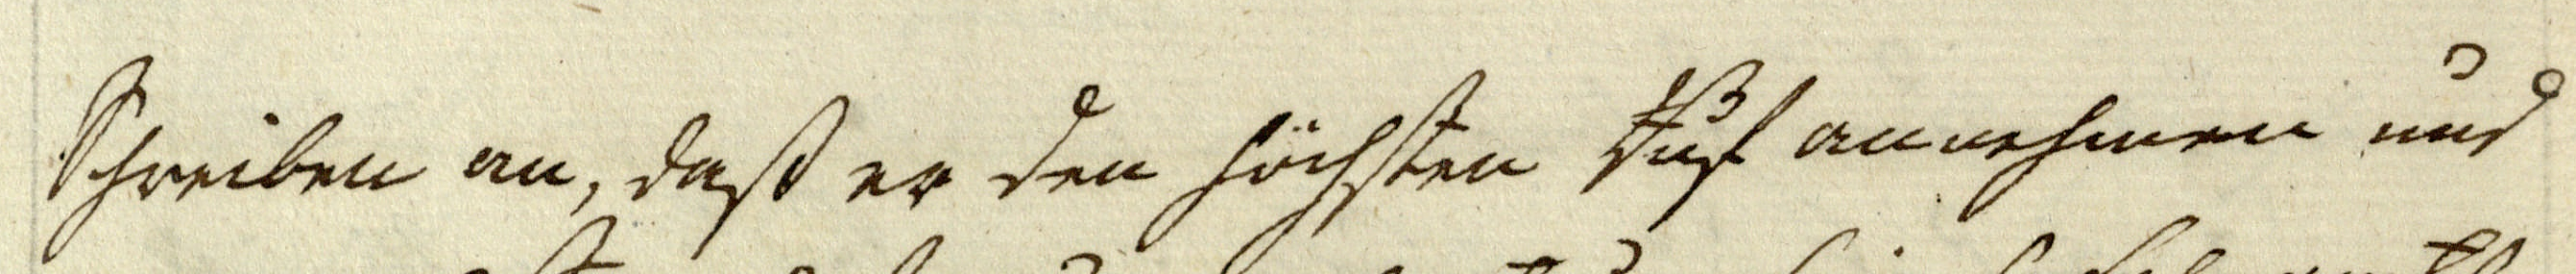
Schreiben an, daß er den höchsten Ruf annehmen und
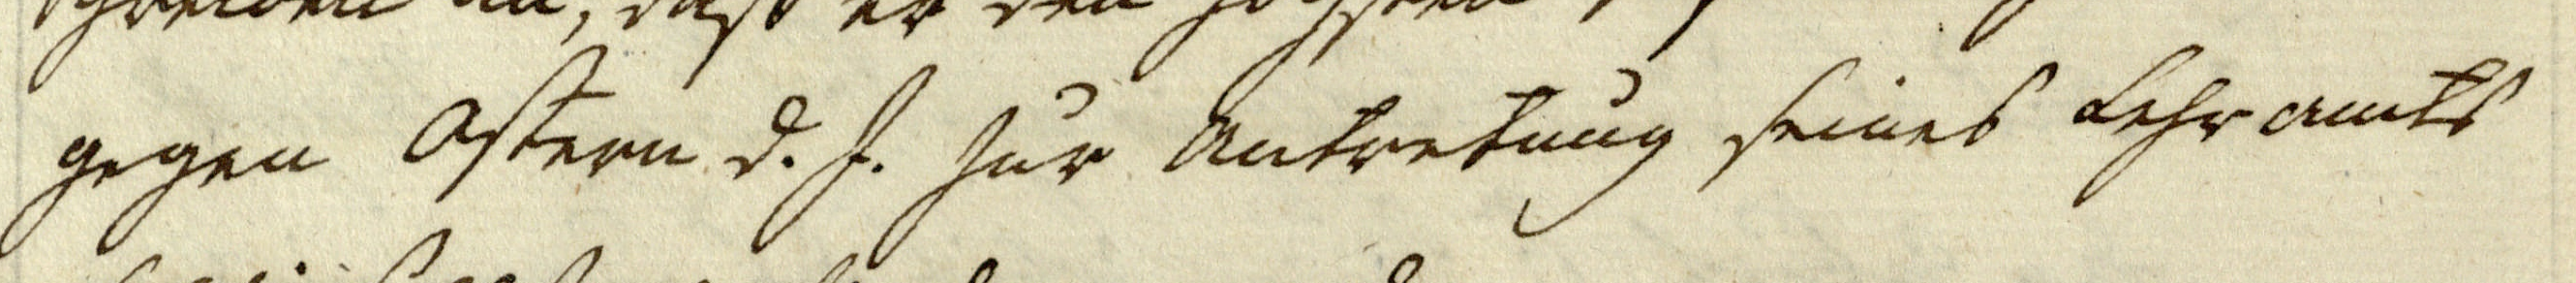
gegen Ostern d. J. zur Antretung seines Lehramts
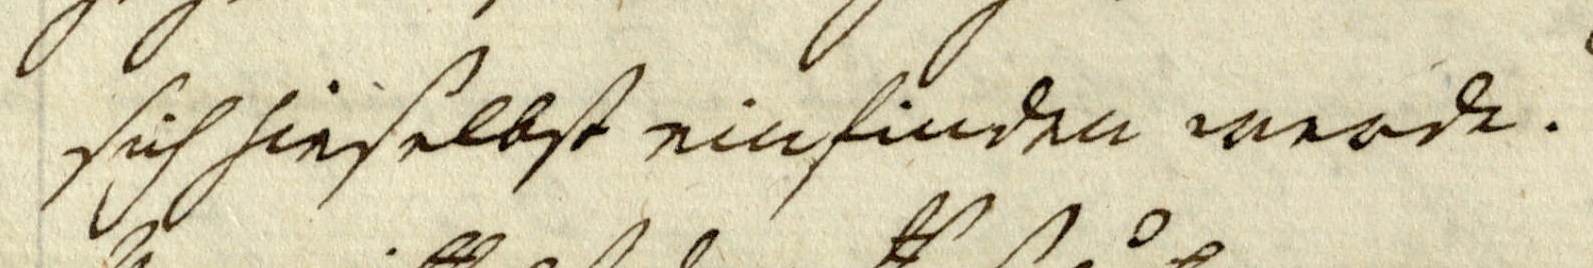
sich hieselbst einfinden werde.
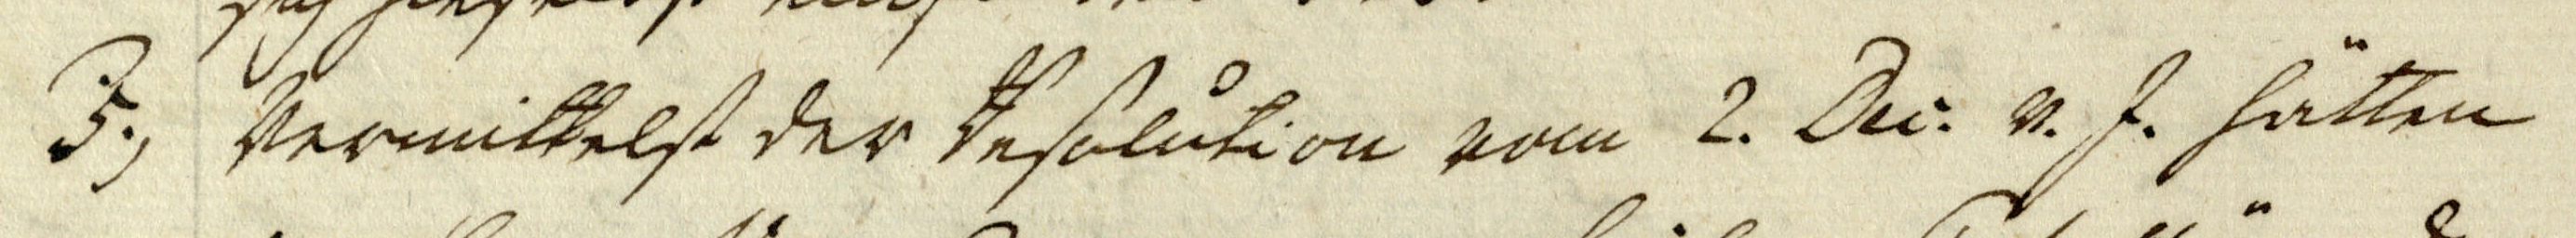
5., Vermittelst der Resolution vom 2. Dec. v. J. hätten
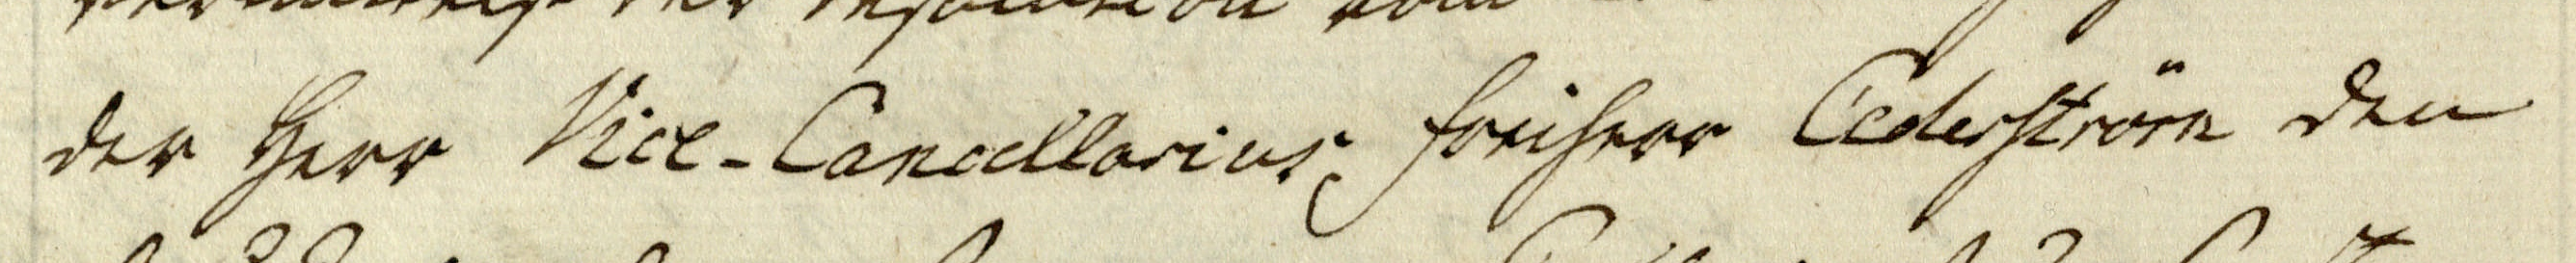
der Herr Vice Cancellarius Freiherr Cederström den
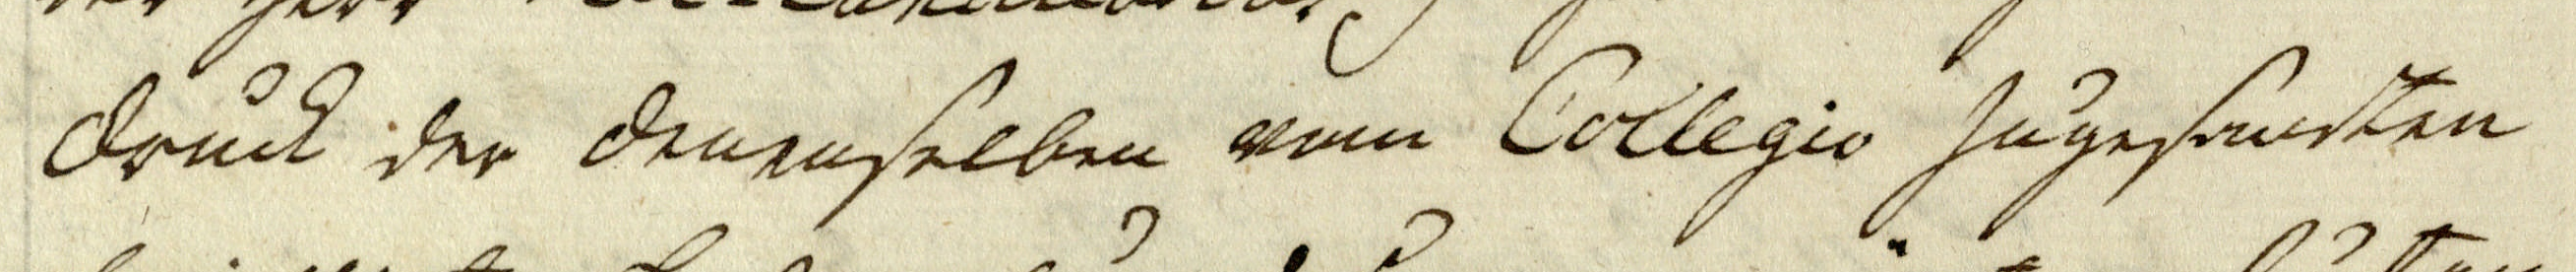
Druck der Denenselben vom Collegio zugesandten
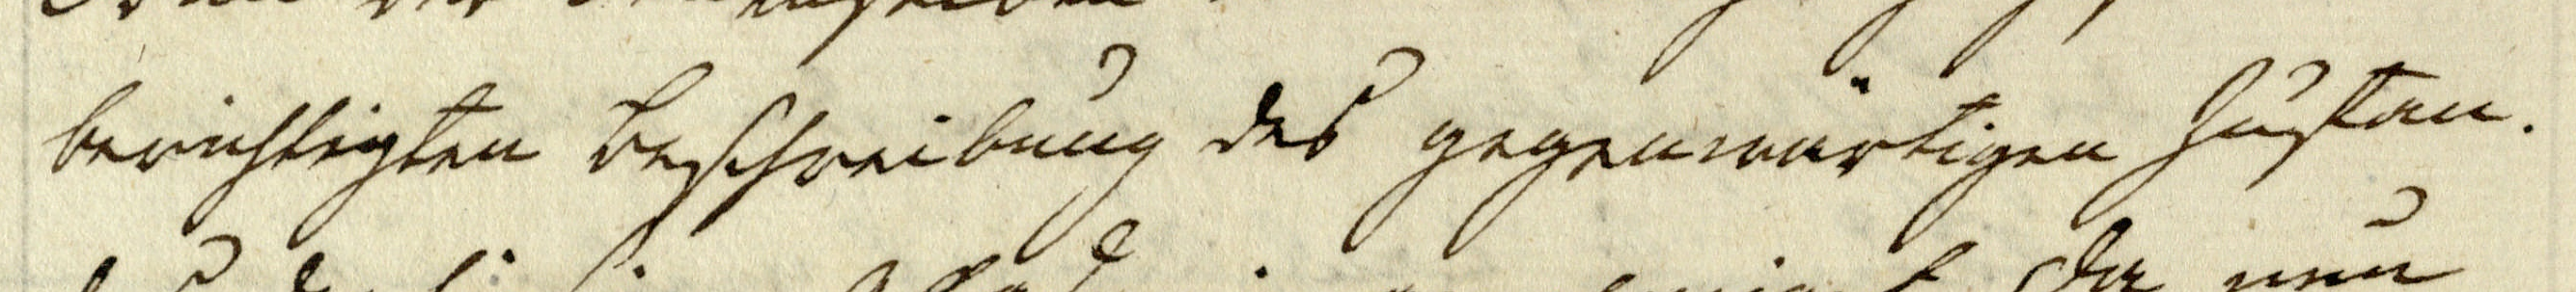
berichtigten Beschreibung des gegenwärtigen Zustan¬
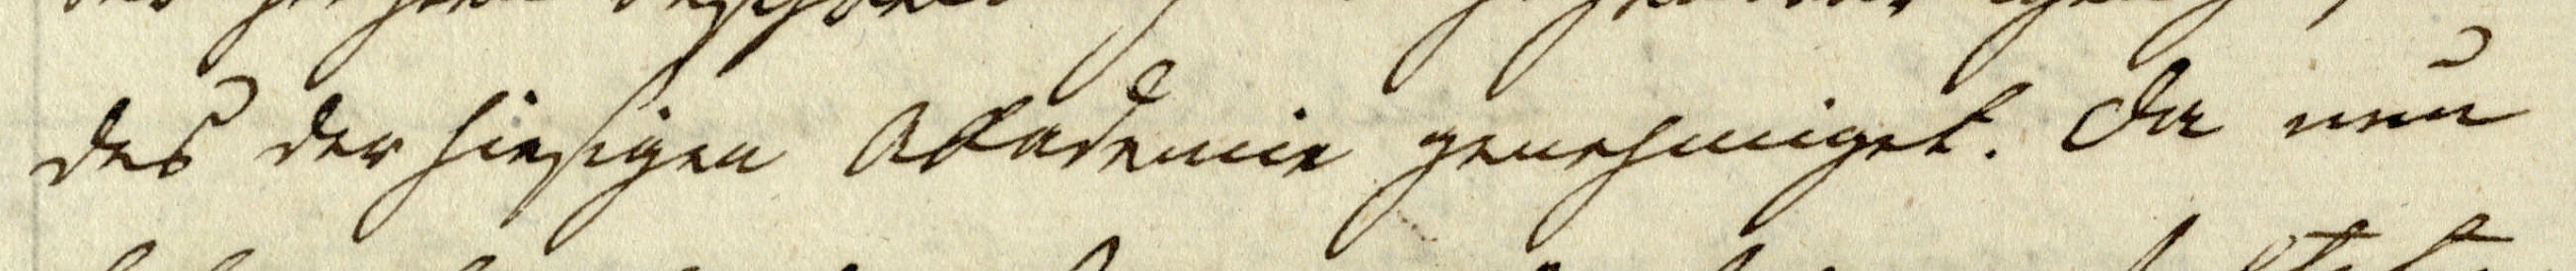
des der hiesigen Akademie genehmiget. Da nun
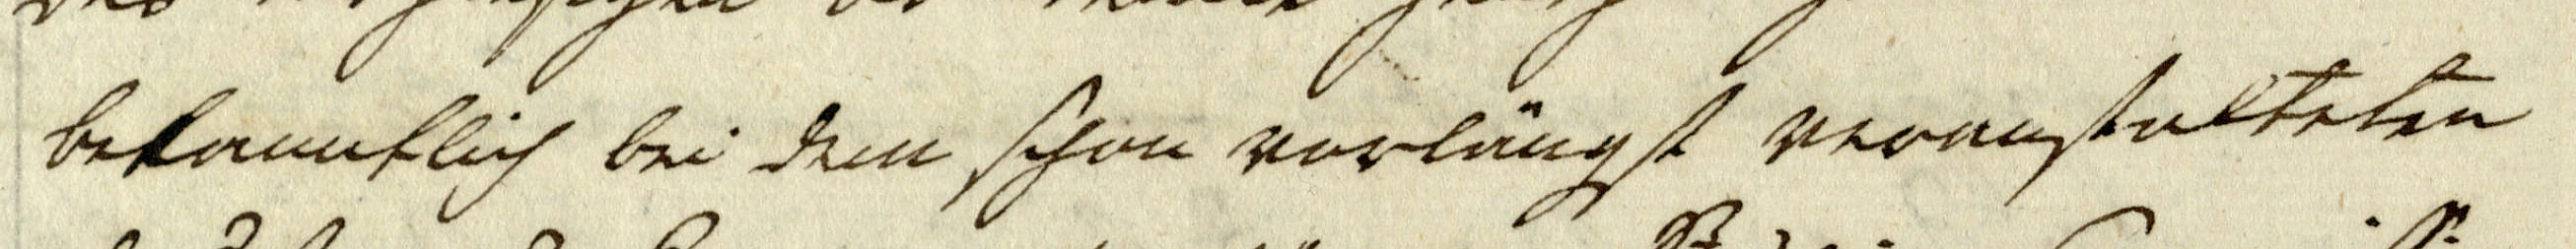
bekanntlich bei dem schon vorlängst veranstalteten
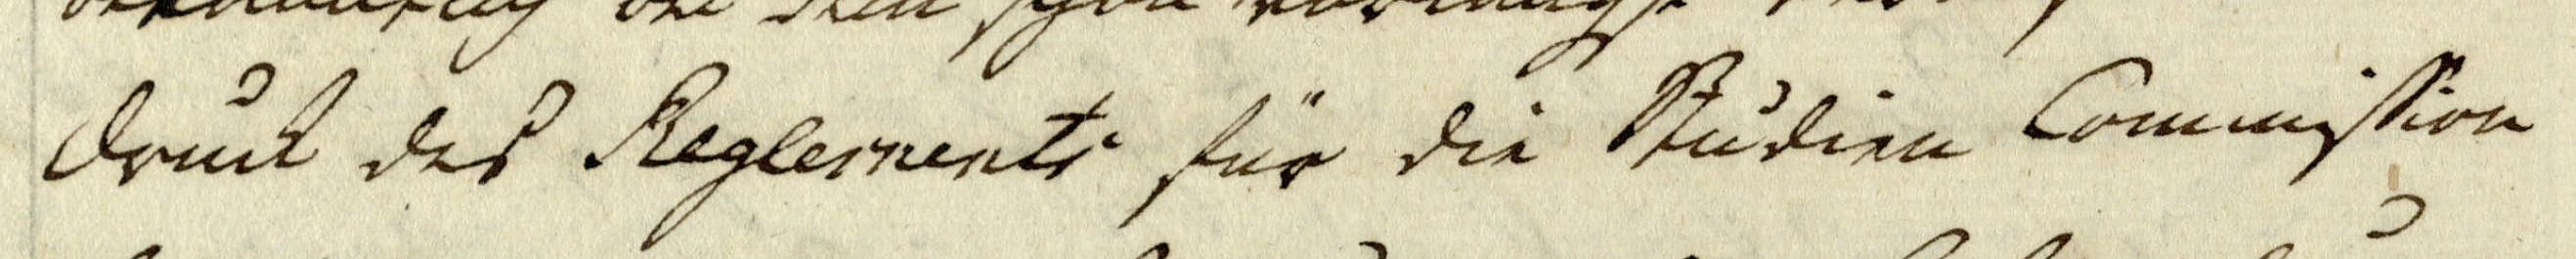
Druck des Reglements für die Studien Commission
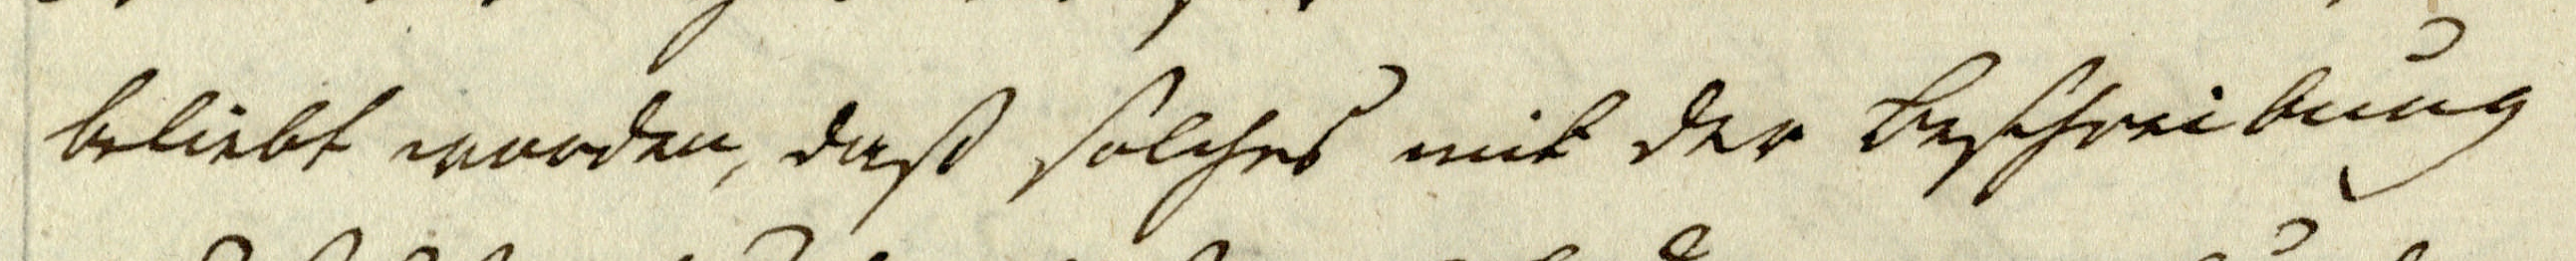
beliebt worden, daß solches mit der Beschreibung
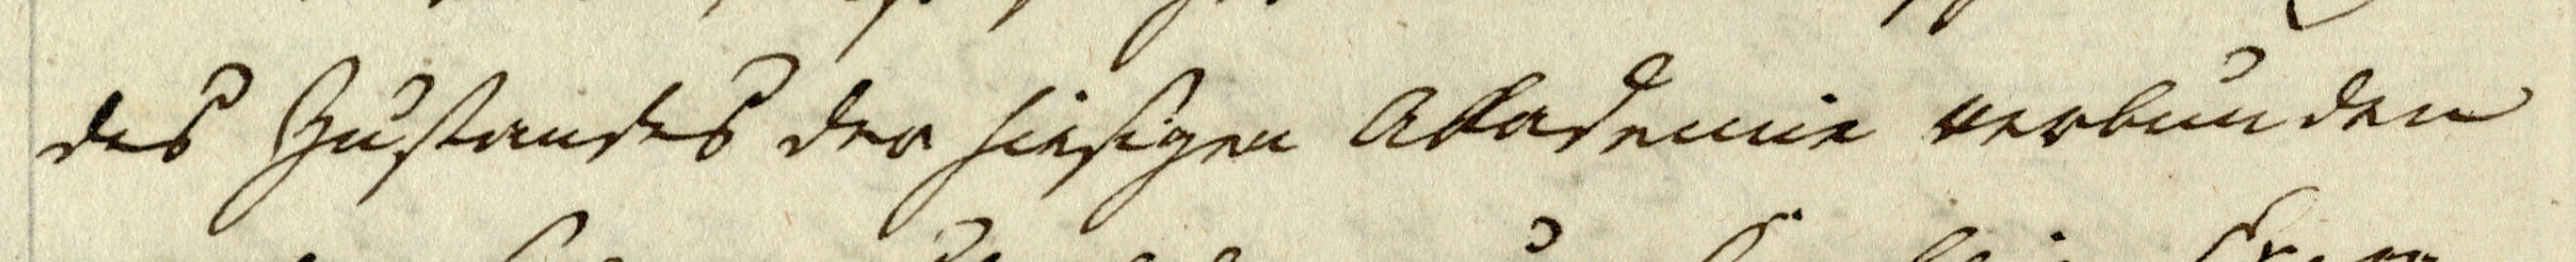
des Zustandes der hiesigen Akademie verbunden
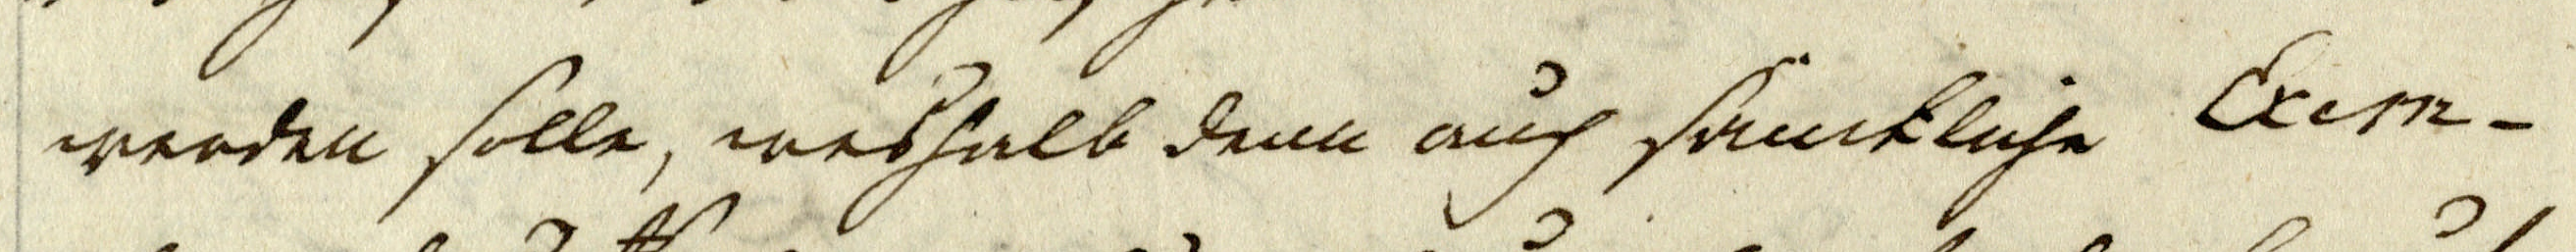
werden solle, weshalb denn auch sämtliche Exem¬
